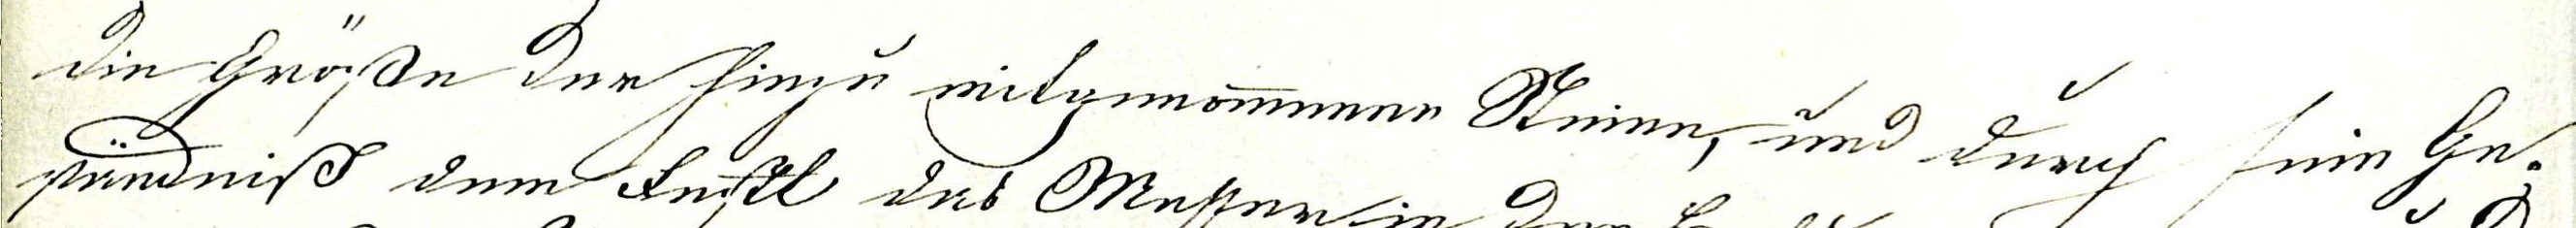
die Größe der hinzu mitgenommenen Steine, und durch sein Ge¬
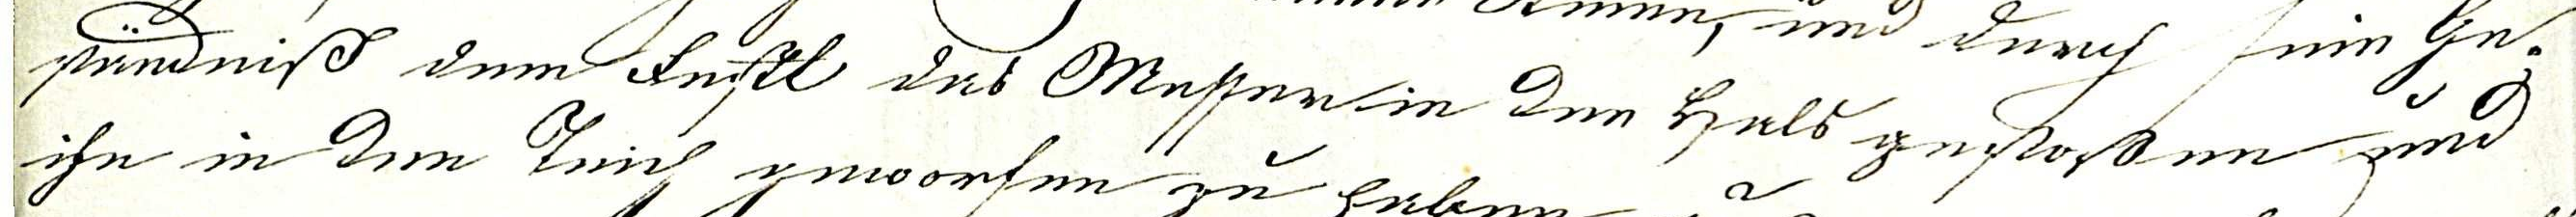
ständniß dem Festl das Messer in den Hals gestoßen und
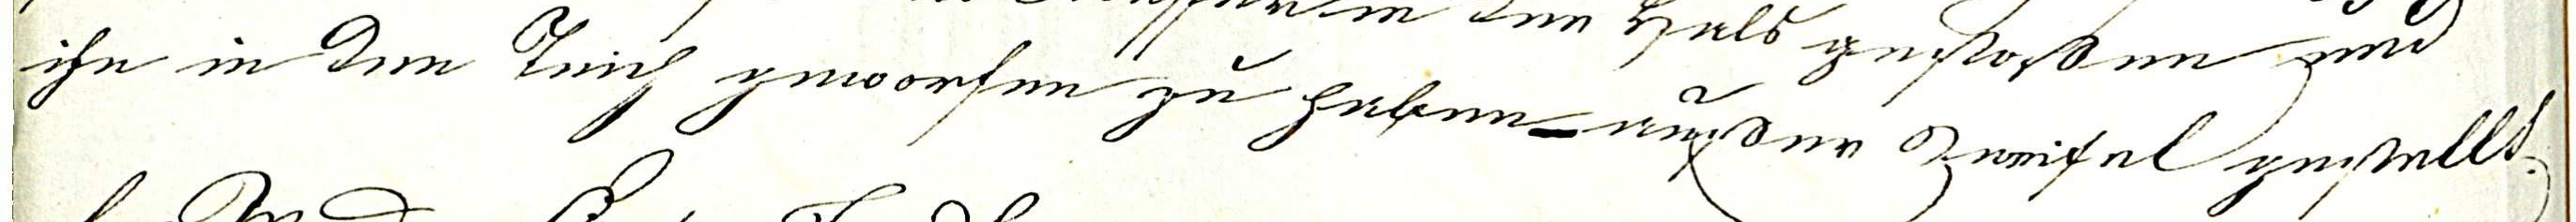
ihn in den Teich geworfen zu haben außer Zweifel gestellt.
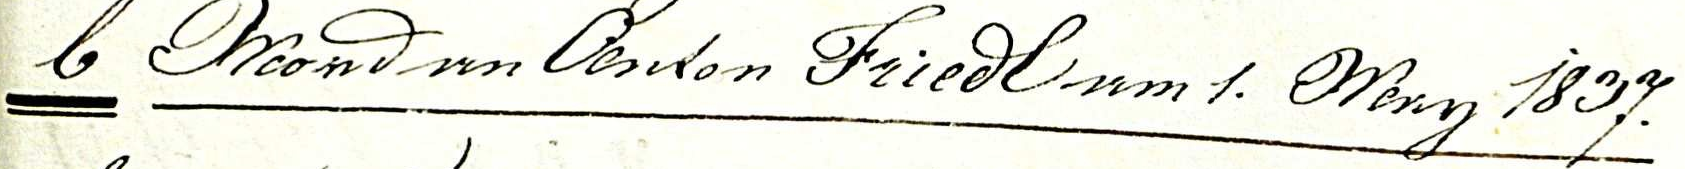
b Mord an Anton Friedl am 1. May 1837
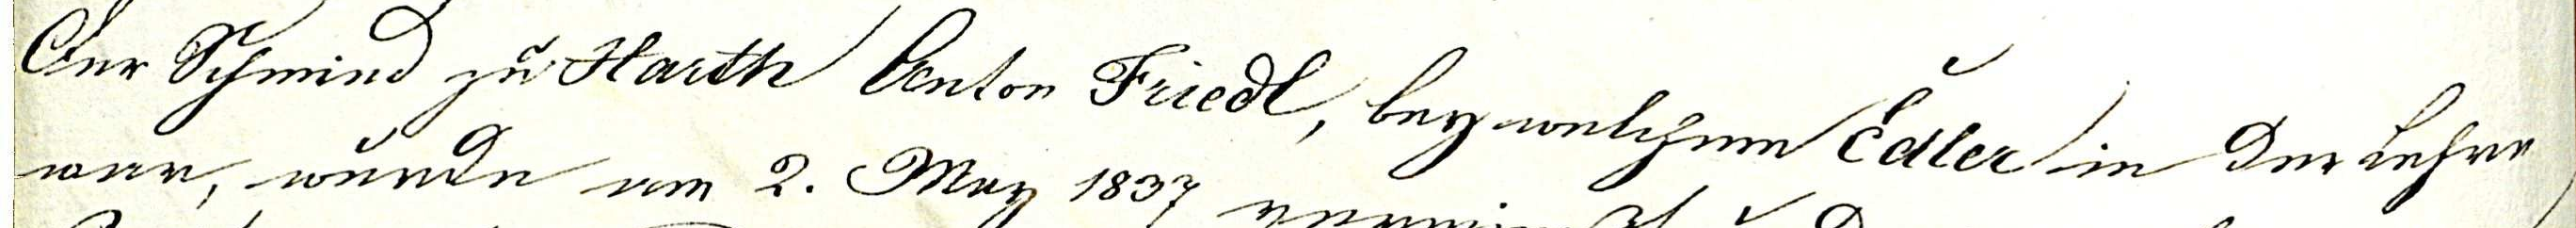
Der Schmid zu Harth Anton Friedl, bey welchem Edler in der Lehre
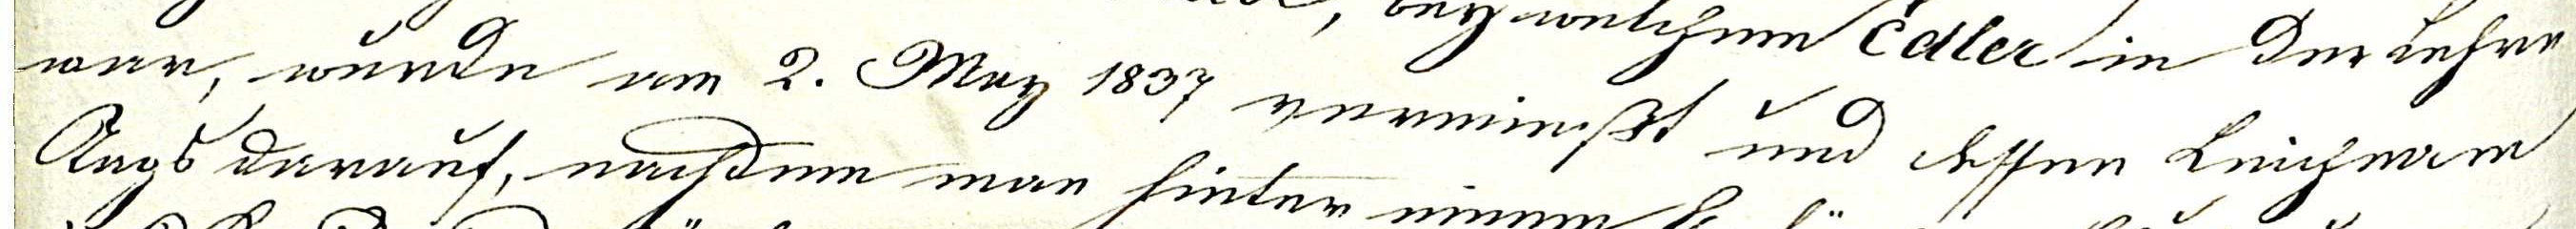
war, wurde am 2. May 1837 vermießt und dessen Leichnam
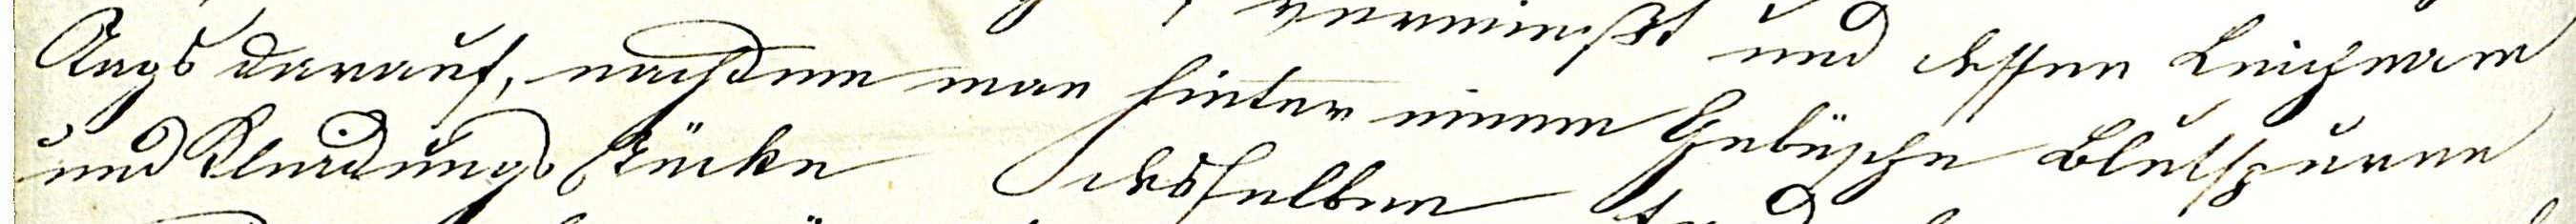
Tags darauf, nachdem man hinter einem Gebüsche Blutspuren
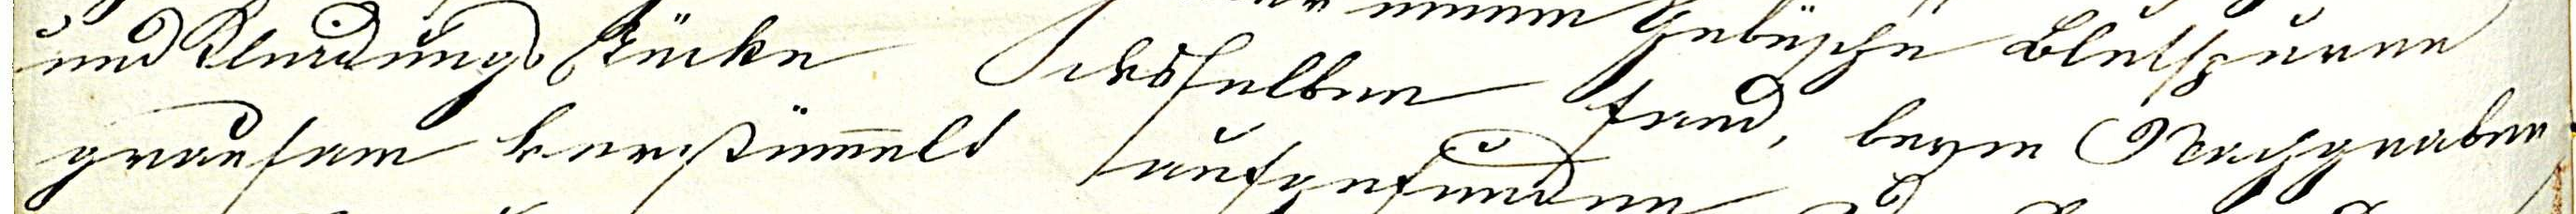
und Kleidungsstücke desselben fand, beym Nachgraben
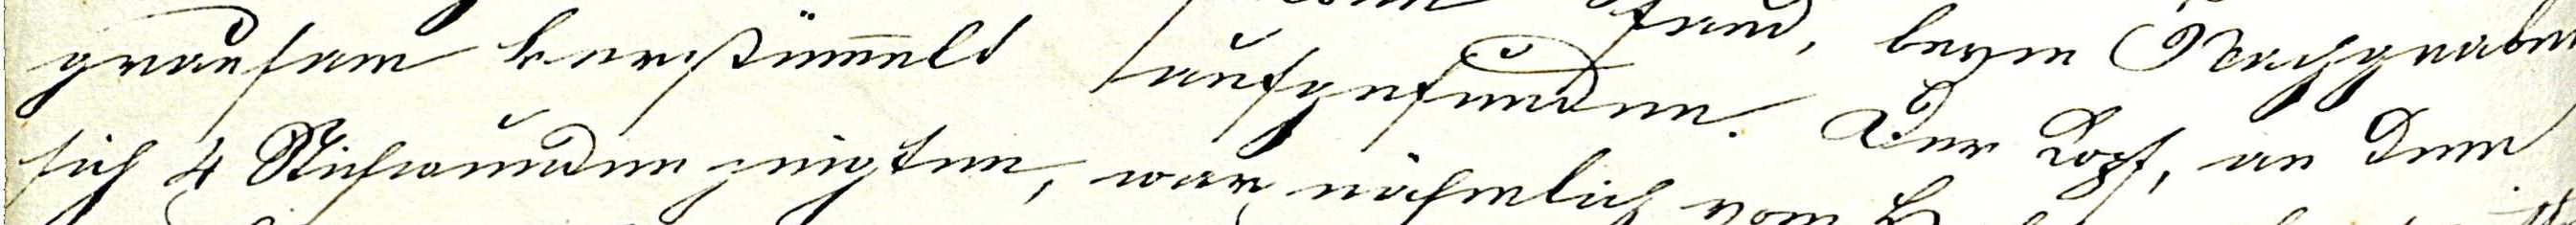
grausam verstümmelt aufgefunden. Der Kopf, an dem
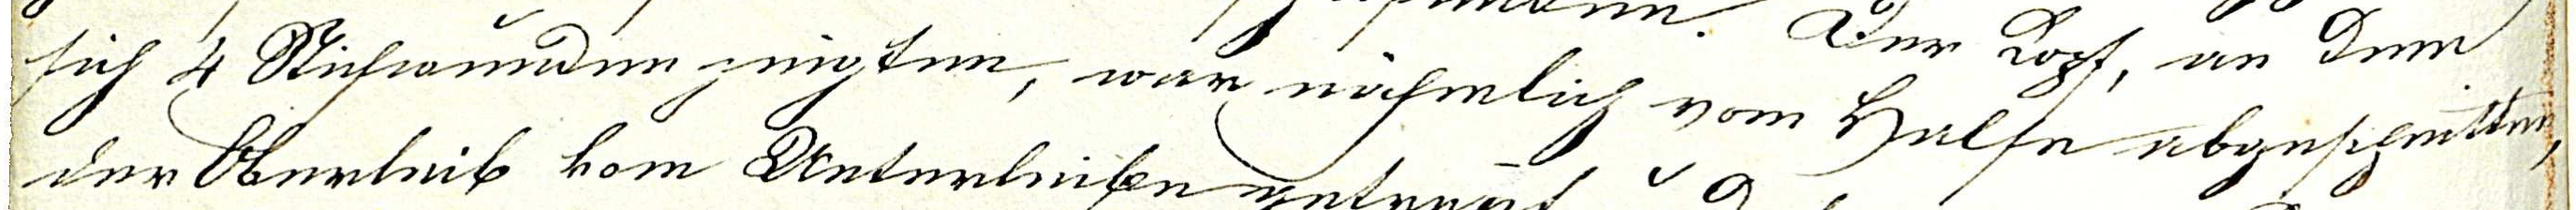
sich 4 Stiefwunden zeigten, war nähmlich vom Halse abgeschnitten,
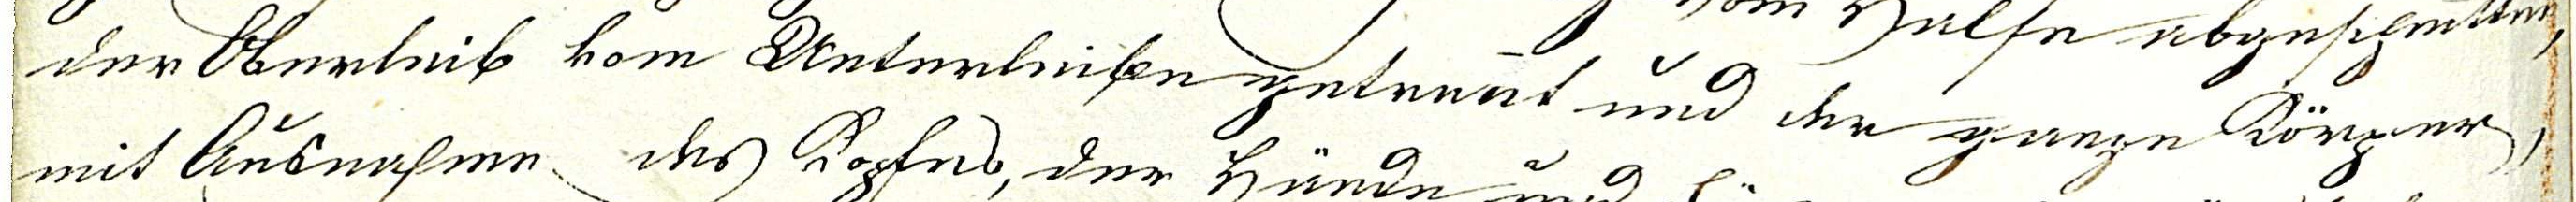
der Oberleib vom Unterleibe getrennt und der ganzen Körper,
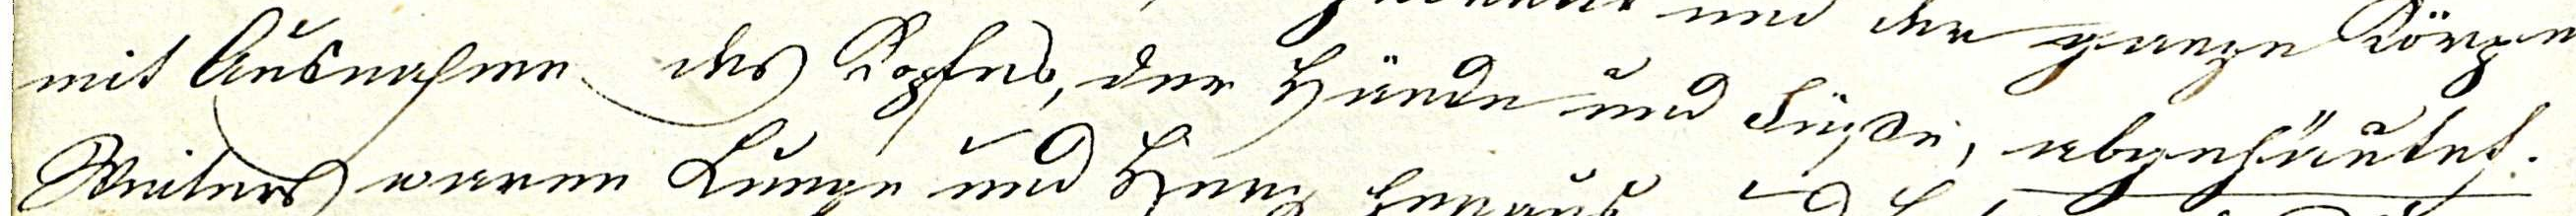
mit Ausnahme des Kopfes, der Hände und Füße, abgehäutet.
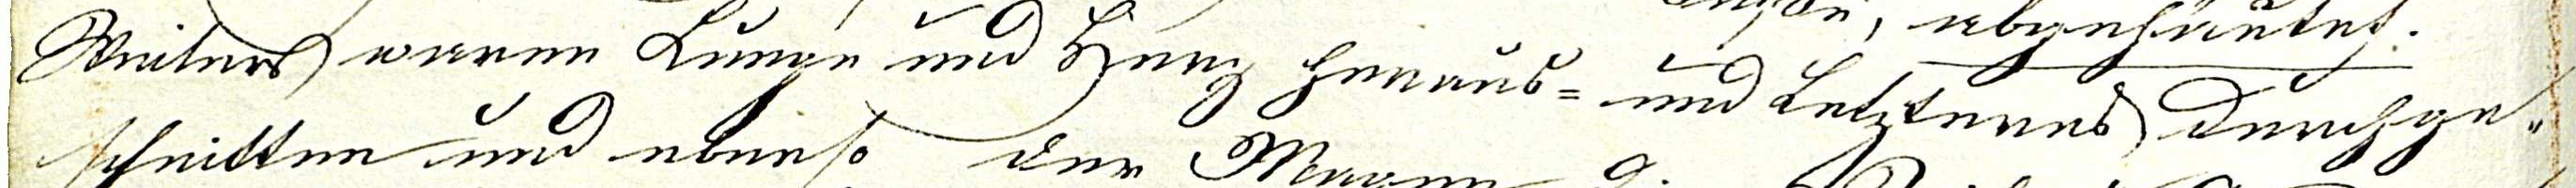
Weiters waren Lunge und Herz heraus- und Letzteres durch ge¬
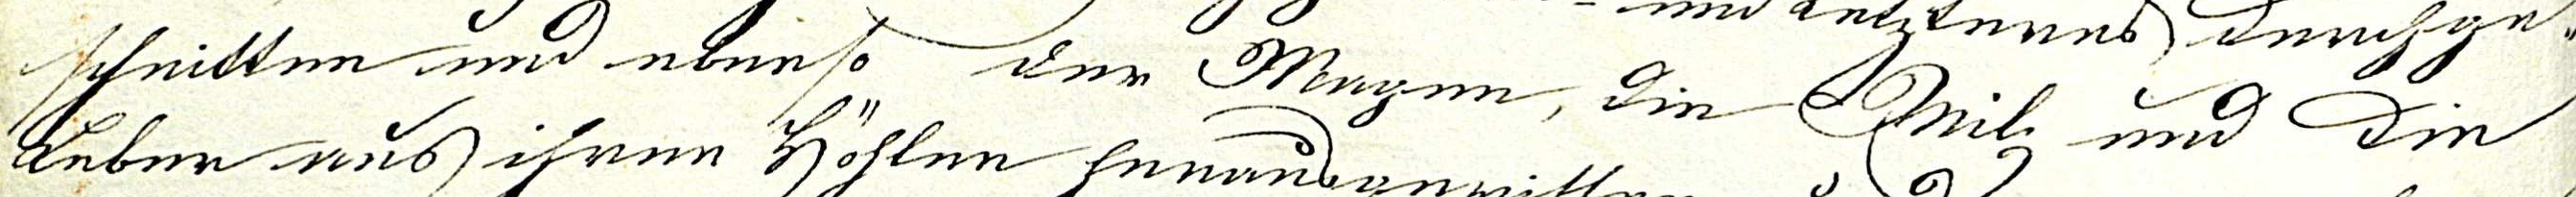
schnitten und ebenso der Magen, die Milz und die
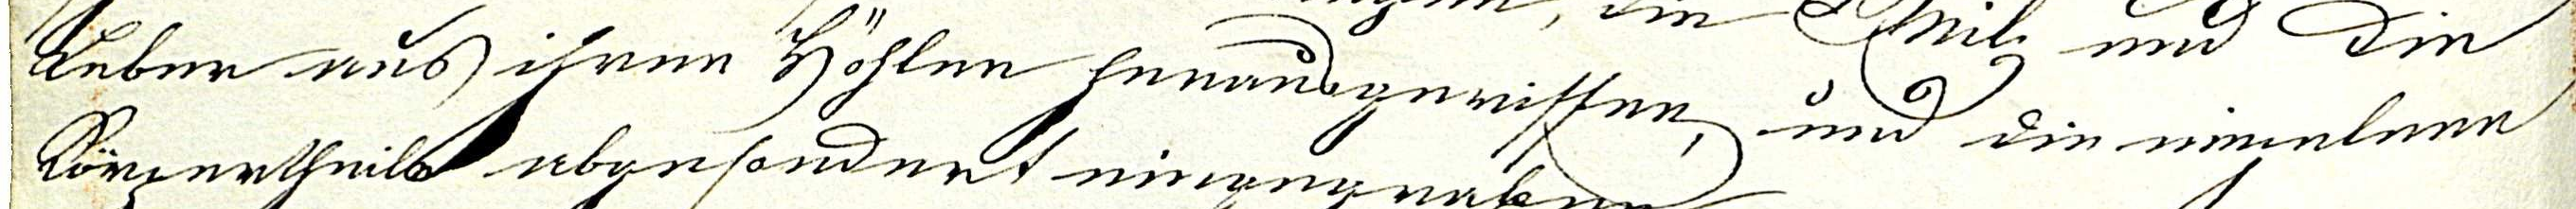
Leber aus ihren Höhlen herausgerissen, und die einzelne
